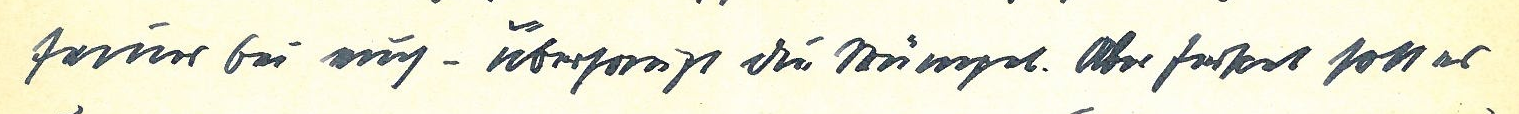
feiner bei euch – überhaupt die Strümpel. Aber Ferkel soll es
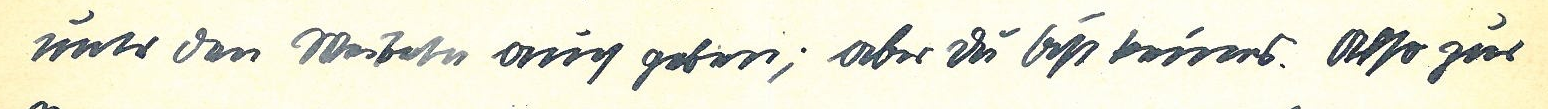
unter den Weibeln auch geben; aber Du bist keines. Also zur
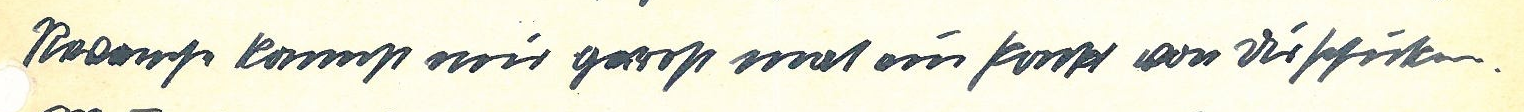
Revenche kannst mir getrost mal ein Packel von Dir schicken.
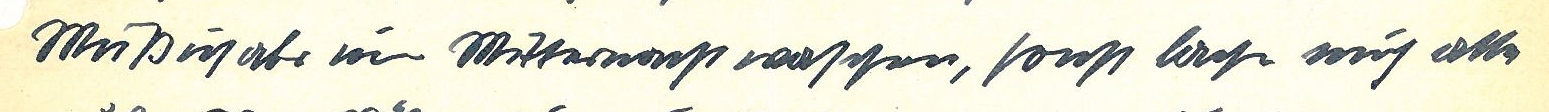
Muß ich aber um Mitternacht waschen, sonst lachen mich alle
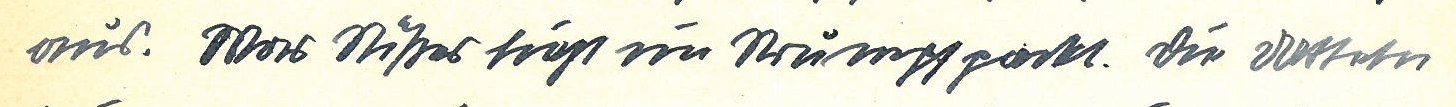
aus. Was Süßes liegt im Strumpfpackel. Die Datteln
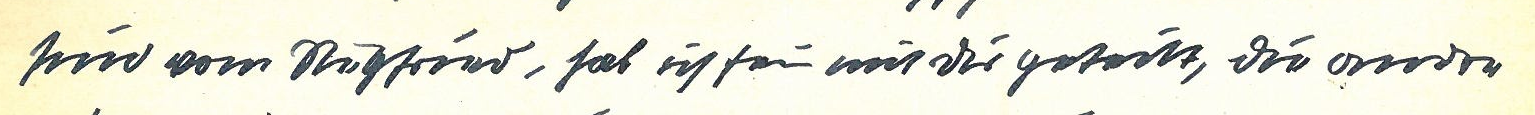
sind vom S., hab ich fein mit Dir geteilt, die andre
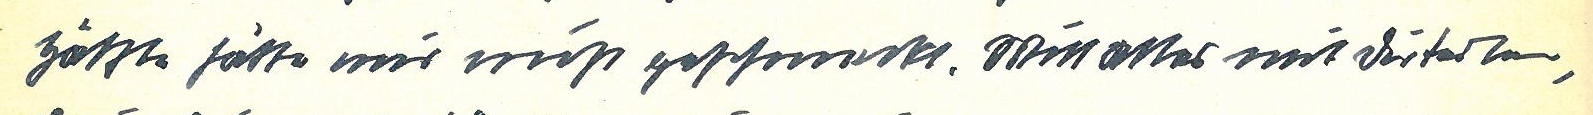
Hälfte hätte mir nicht geschmeckt. Will alles mit Dir teilen,
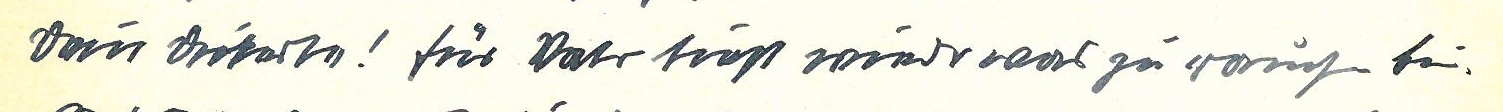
Dein Dickerle! Für Vater liegt wieder was zu rauchen bei.
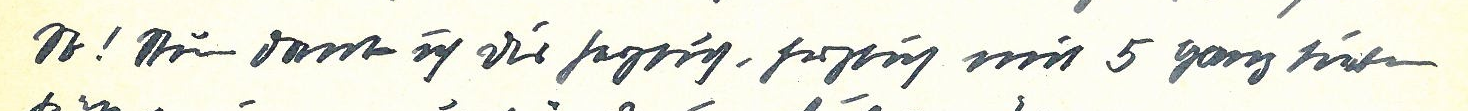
So, nun danke ich Dir herzlich, herzlich mit 5 ganz lieben
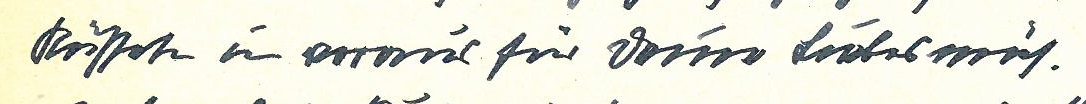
Küsseln im voraus für deine Liebesmüh.
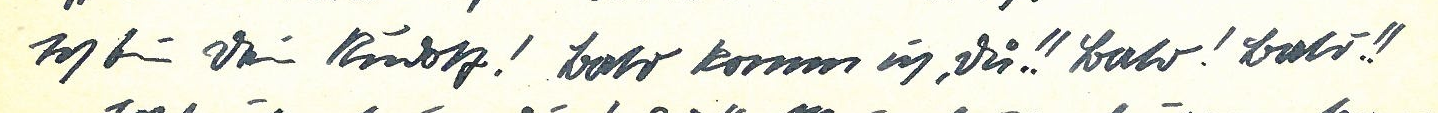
Ich bin Dein ! Bald komme ich, Du!! Bald! Bald!!
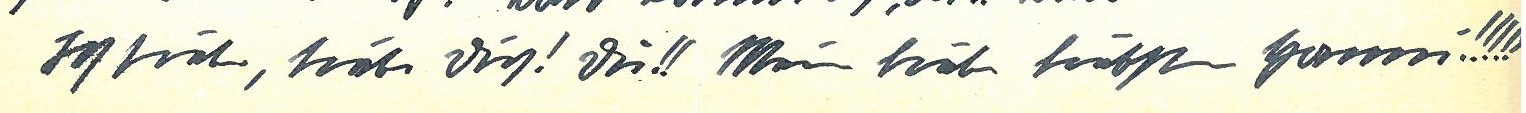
Ich liebe, liebe Dich! Du!! Meine liebe liebste !!!!!
